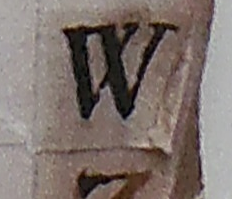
W
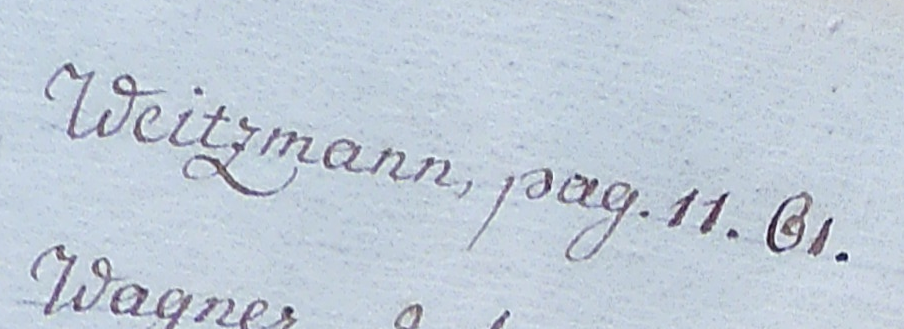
Weitzmann, pag. 11. 61.
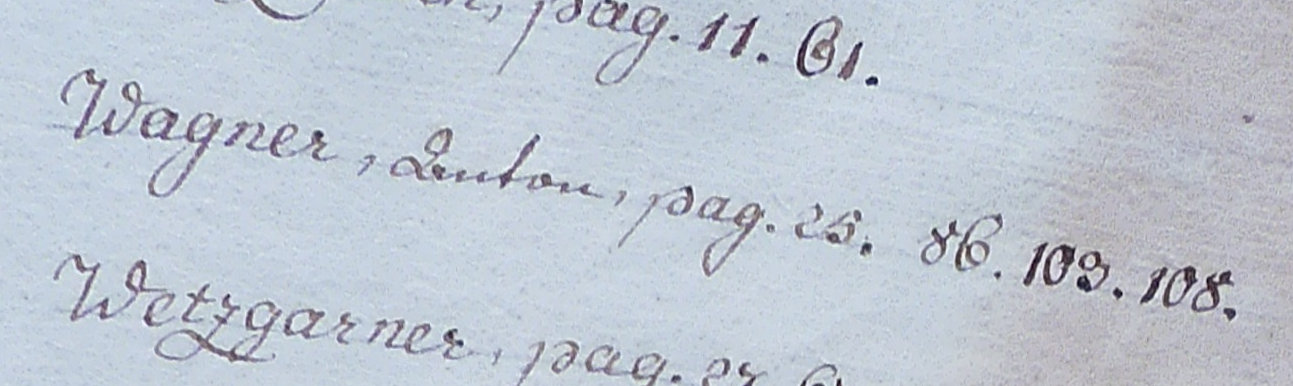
Wagner, Anton, pag. 25. 86. 103. 108.
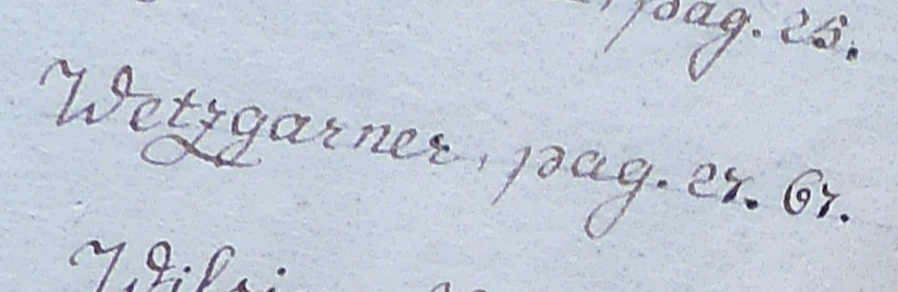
Wetzgarner, pag. 27. 67.
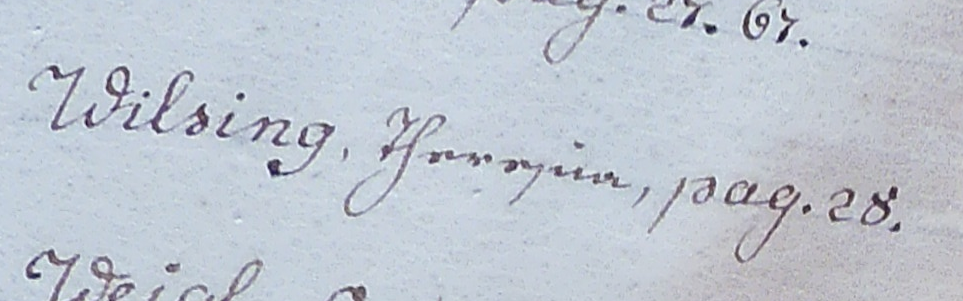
Wilsing, Theresia, pag. 28.
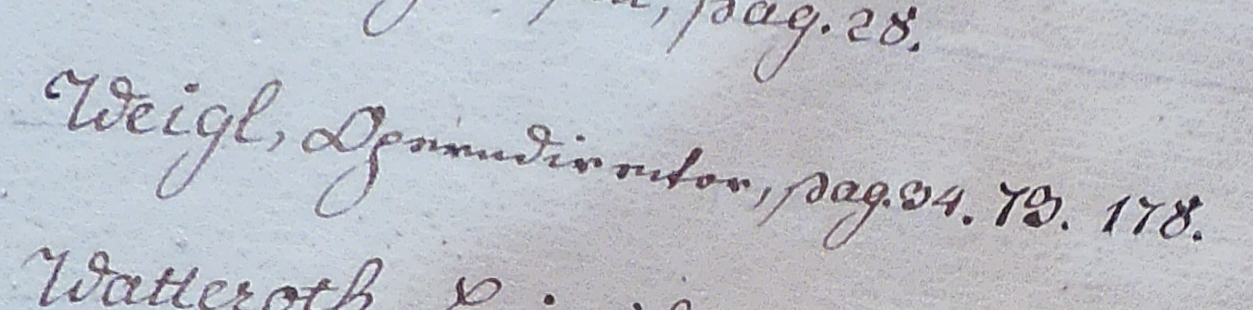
Weigl, Operndirector, pag. 34. 73. 178.
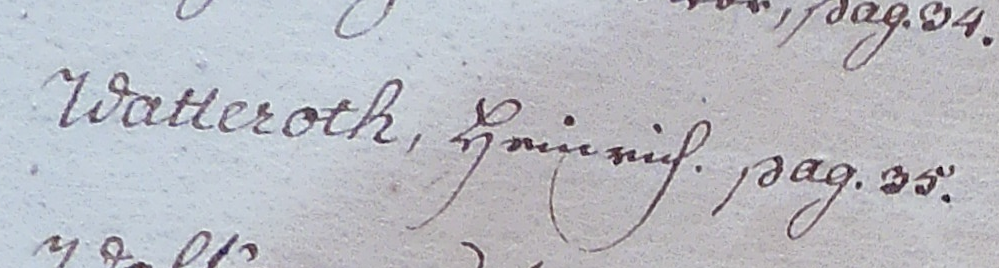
Watteroth, Heinrich. pag. 35.
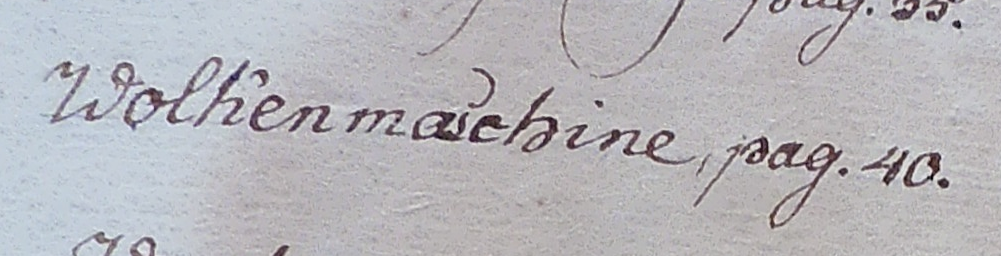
Wolkenmaschine, pag. 40.
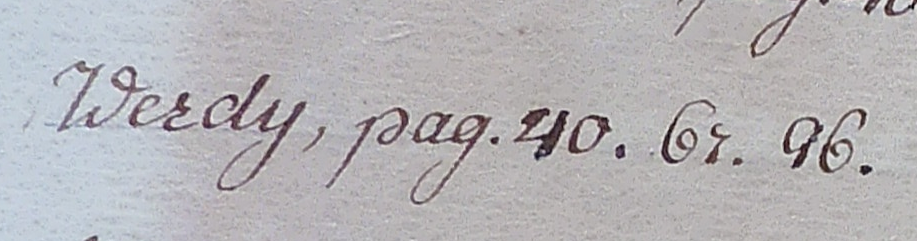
Werdy, pag. 40. 67. 96.
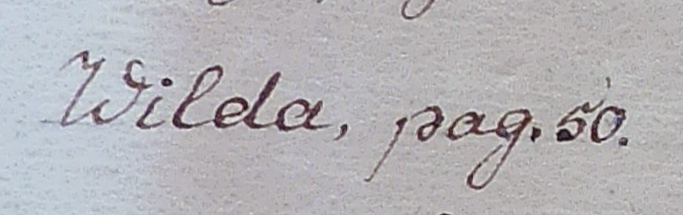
Wilda, pag.50.
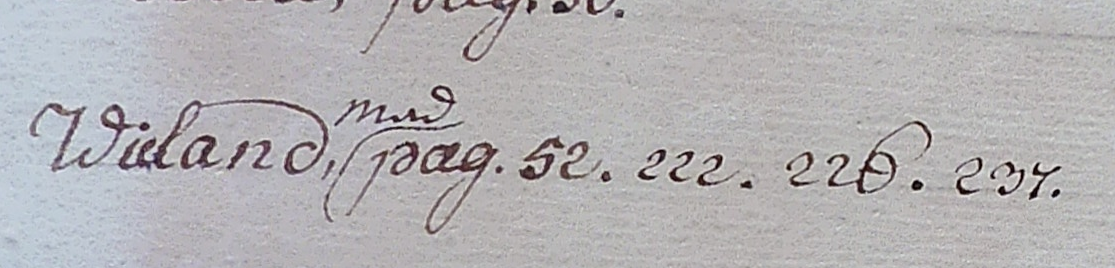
Wieland,Madpag. 52. 222. 226. 237.
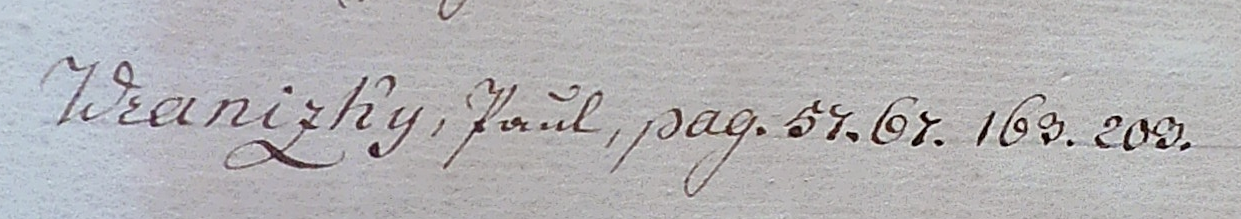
Wranizky, Paul, pag. 57. 67. 163. 203.
